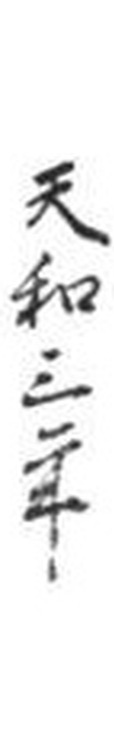天和三年
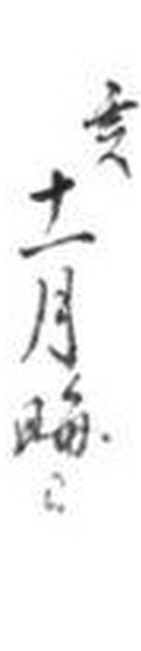十一月晦日
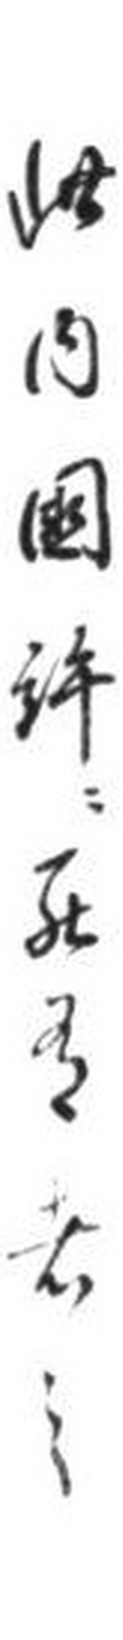此内国許ニ罷有者之
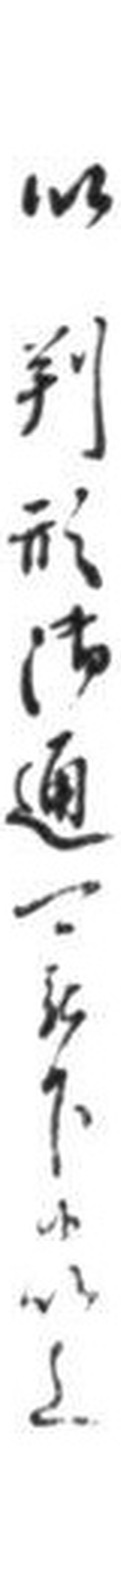以判形御通可被下候以上
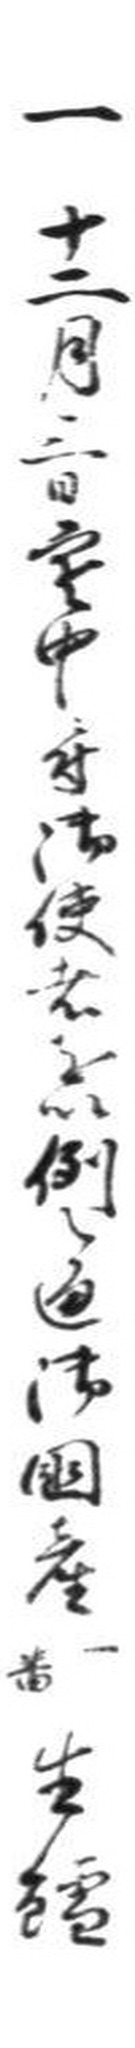一十二月三日寒中ニ付御使者を以例之通御国産一番生鱈
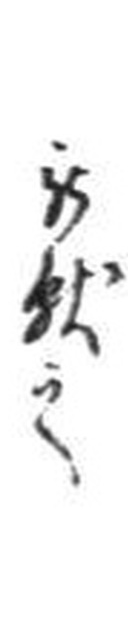被献之
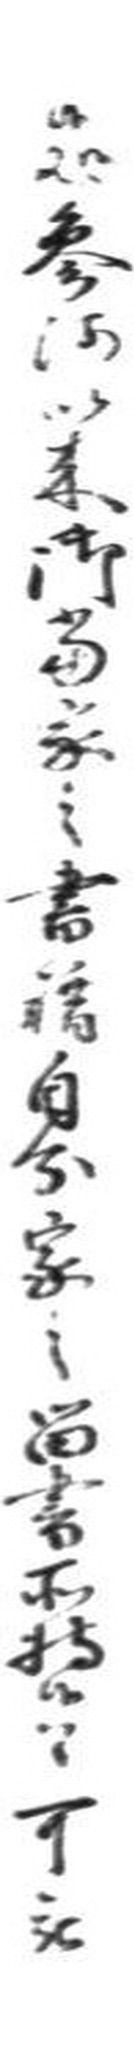候処参河以来御当家之書籍自分家之留書所持候ハヽ可被
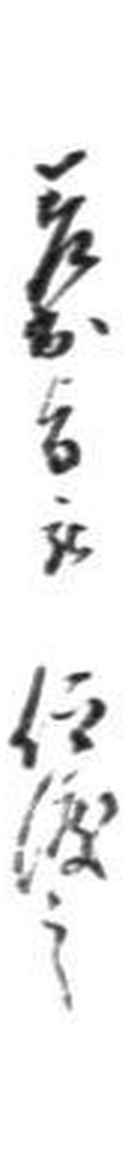差出旨被仰渡之
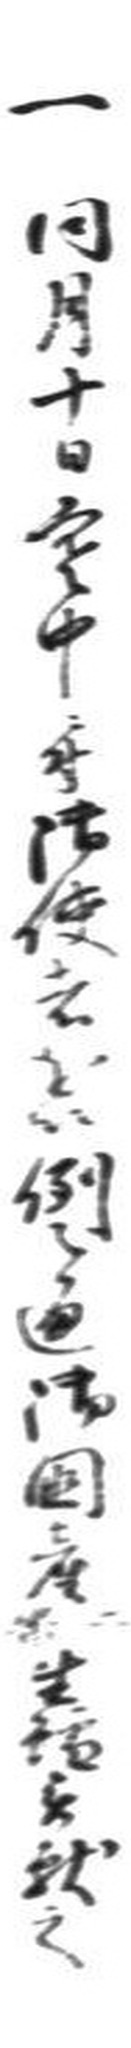一同月十日寒中ニ付御使者を以例之通御国産二番生鱈被献之
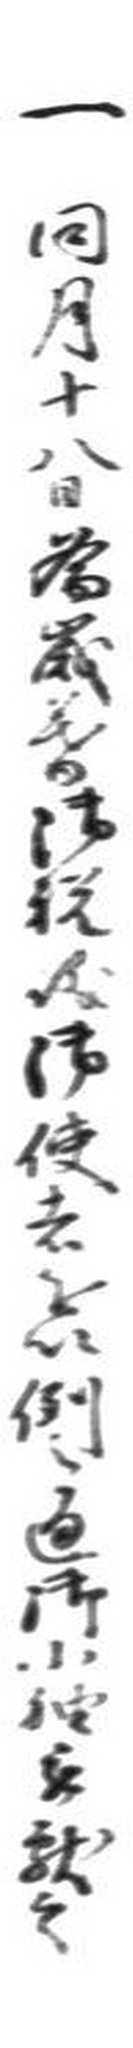一同月十八日為歳暮御祝儀御使者を以例之通御小袖被献之
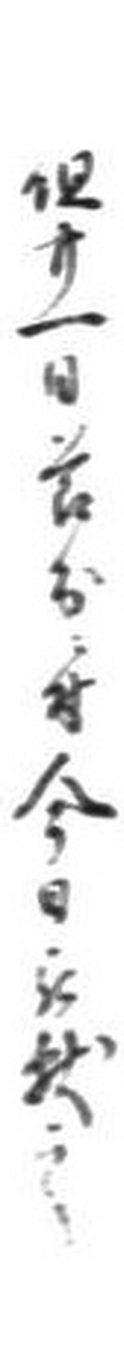但廿一日節分ニ付今日被献之
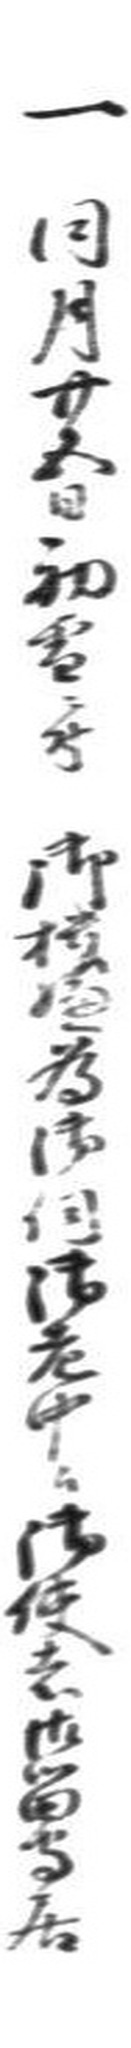一同月廿五日初雪ニ付御機嫌為御伺御老中江御使者御留守居

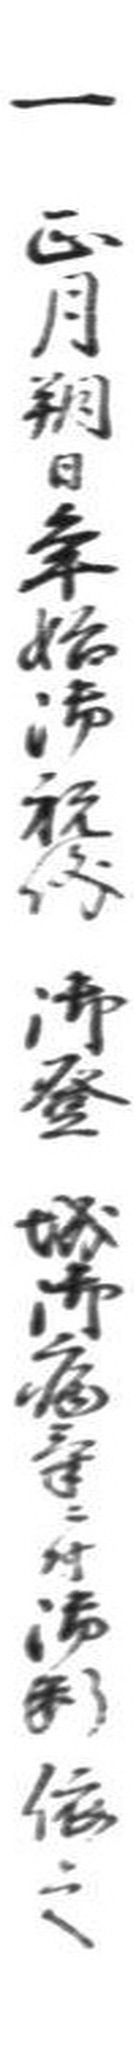一正月朔日年始御祝儀御登城御病気ニ付御断依之
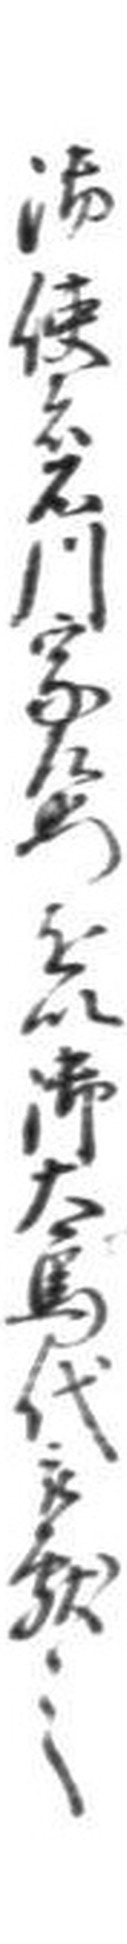御使者石川宗左衛門を以御太刀馬代被献之
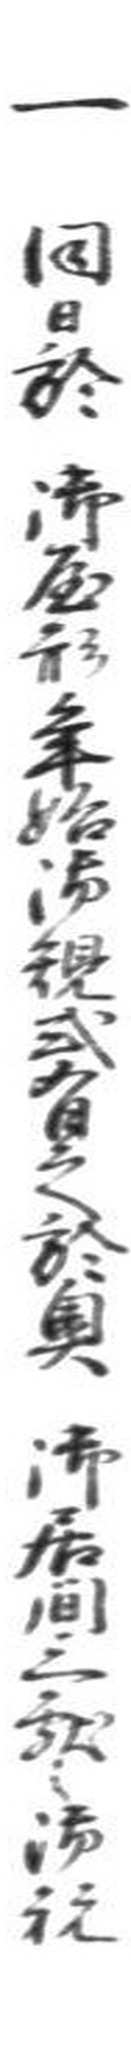一同日於御屋形年始御規式有之於奥御居間三献之御祝
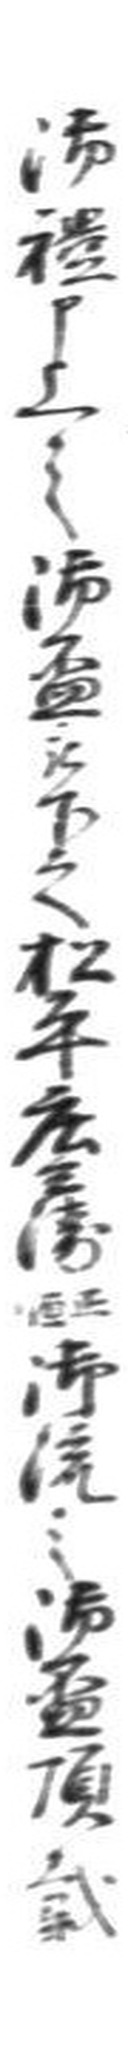御礼申上之御盃被下之松平庄兵衛正恒御流之御盃頂戴
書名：家譜 十五 綱昌公 従天和元年到元禄十二年
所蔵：福井県文書館 Fukui Prefectural Archives
